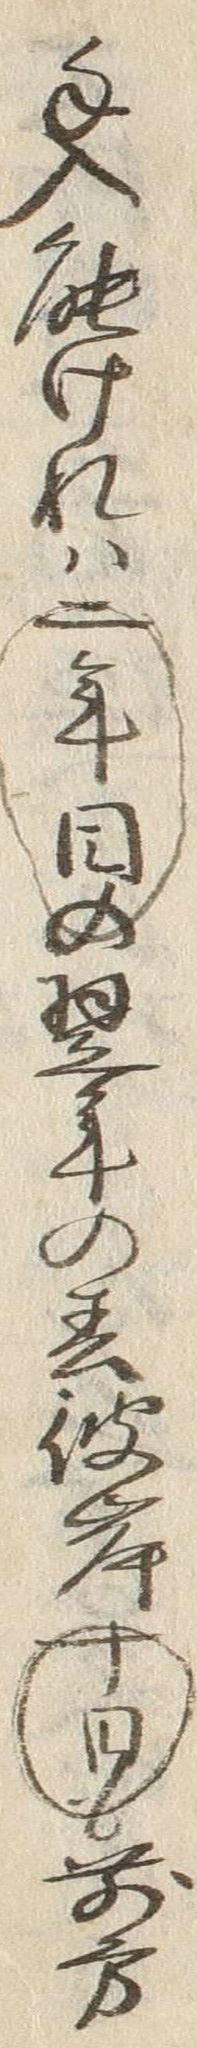手入能けれは二年目の翌年の春彼岸十日も前方
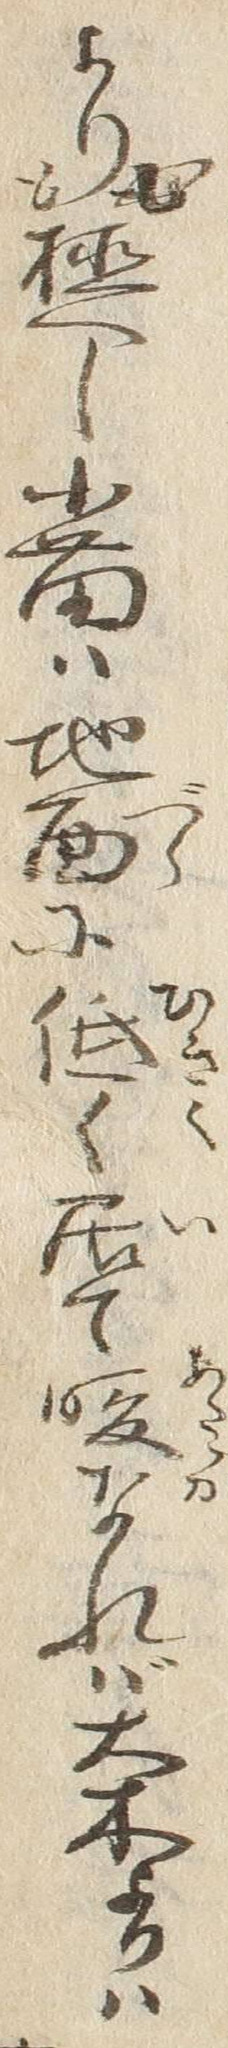よりも植へし小苗は地面尓低く居て暖なれば大木よりは

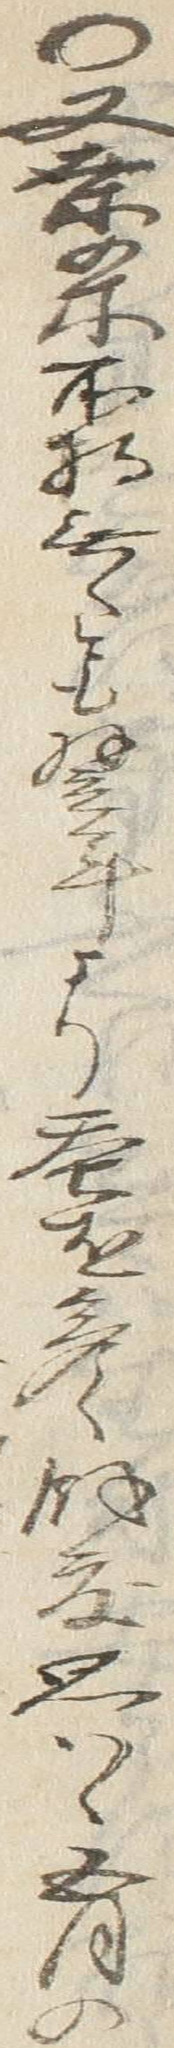〇又桑の木所持無くとも翌年より蚕を多く飼度思はゞ五月の
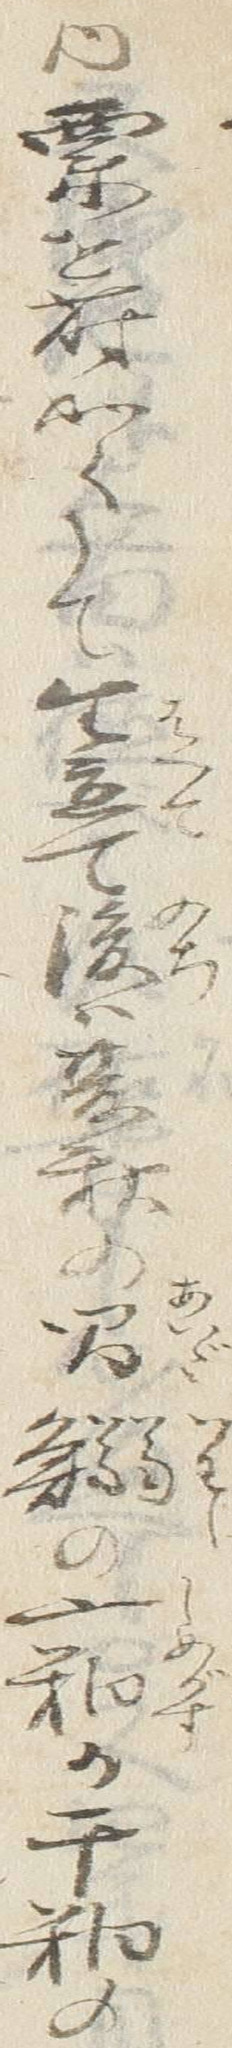内票を蒔如くして生立て後は夏秋の間鰯の〆粕の干粕の
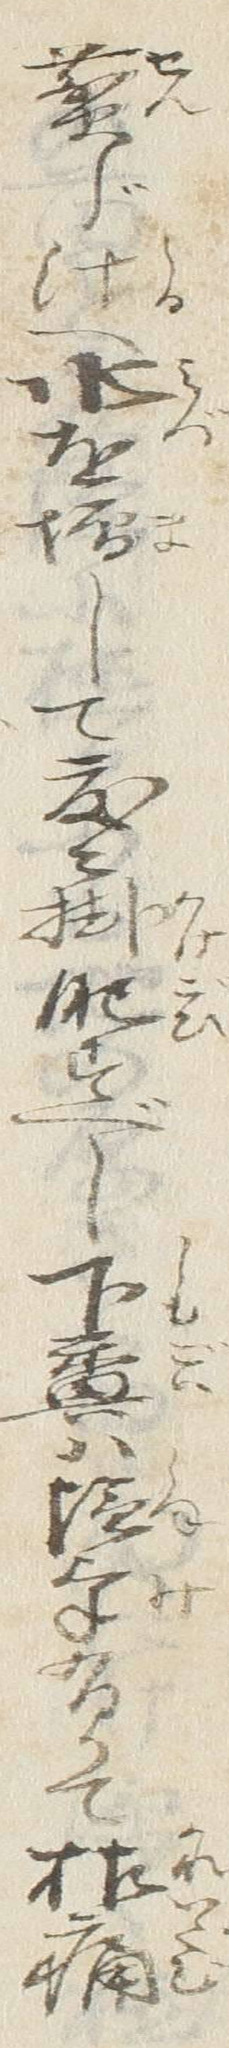煎じ汁へ水を増して度々掛肥春べし下糞は塩氣有りて枯痛
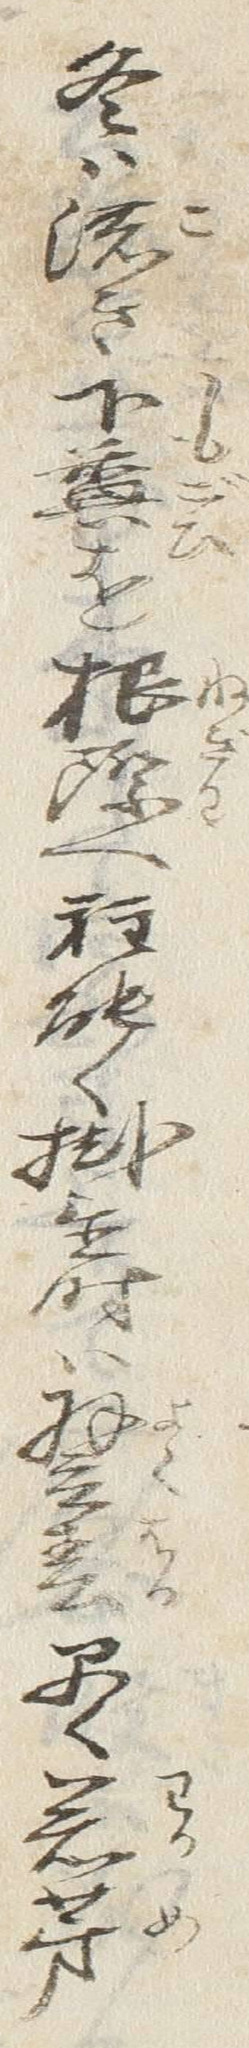冬は濃き下糞を根際へ程能く掛置時は翌春早く若芽
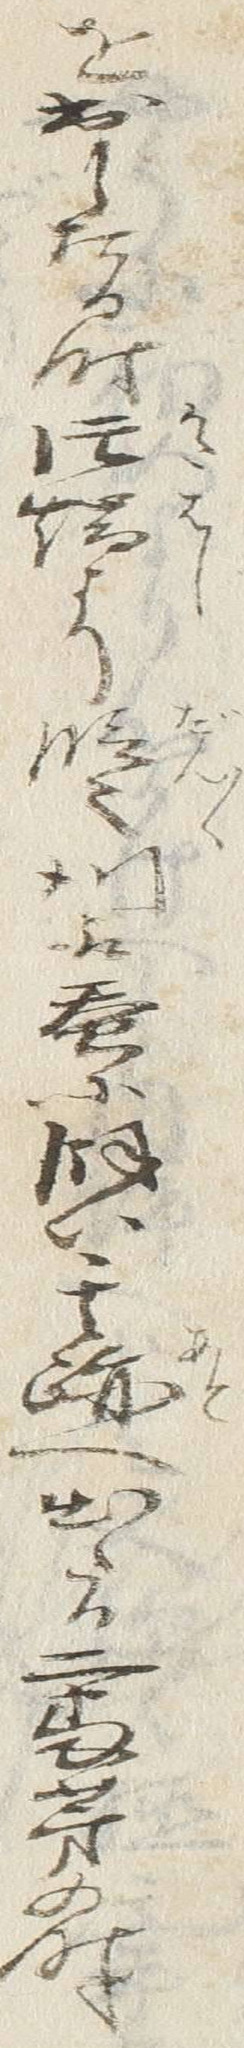を出したる時片端より段々刈取蚕尓飼い其跡へ出たる二番芽の時
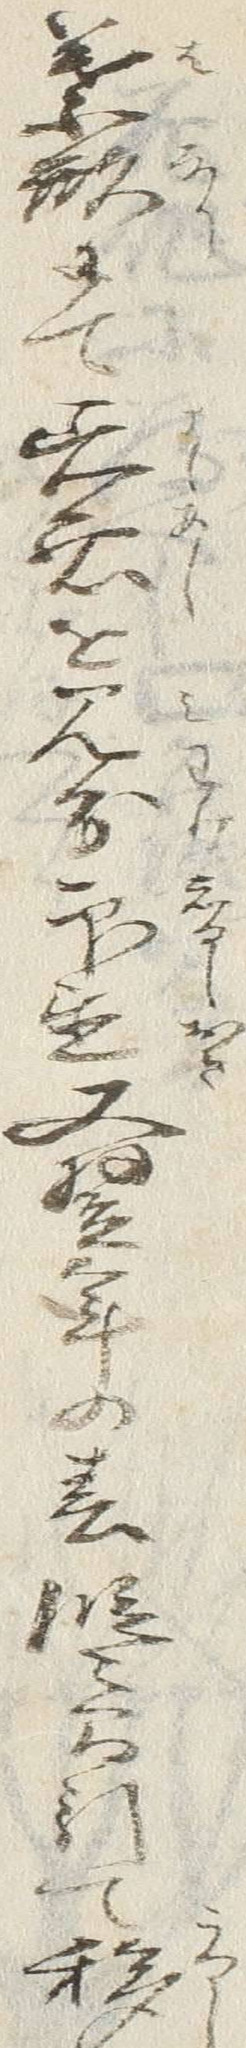葉形尓て善悪を見分印置又翌年の春段々間引て移
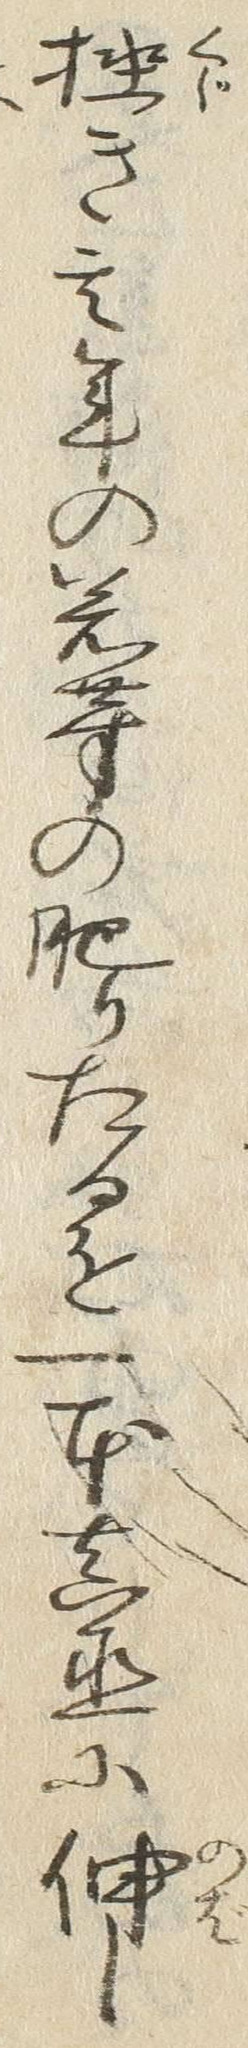挫き其年の若芽の肥りたるを一本真直尓伸し
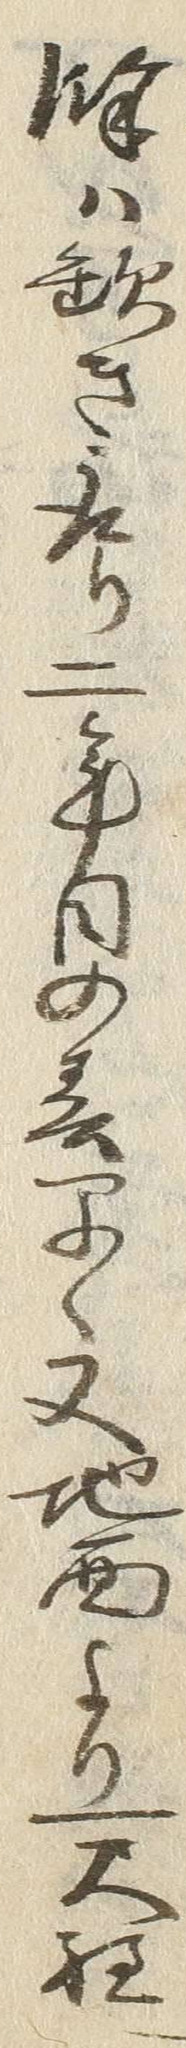餘は缼き取り二年目の春早く又地面より一尺程
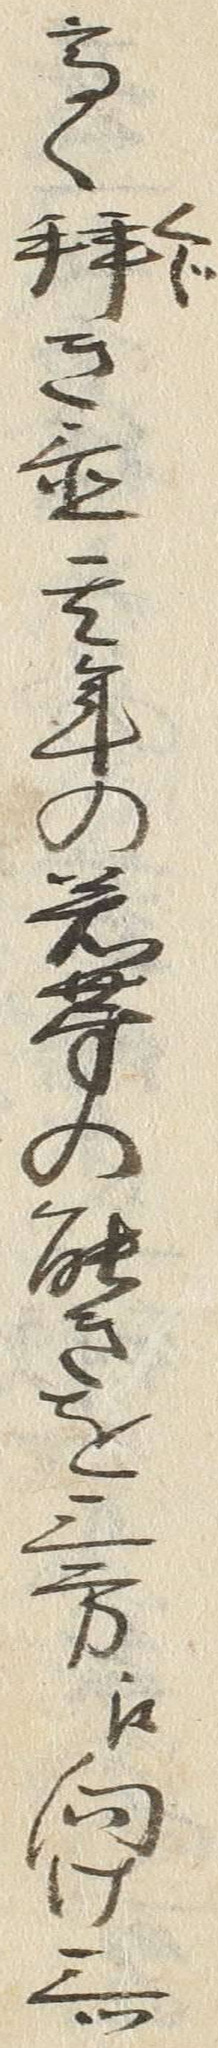高く拜き置其年の若芽の能きを三方江向け三ツ
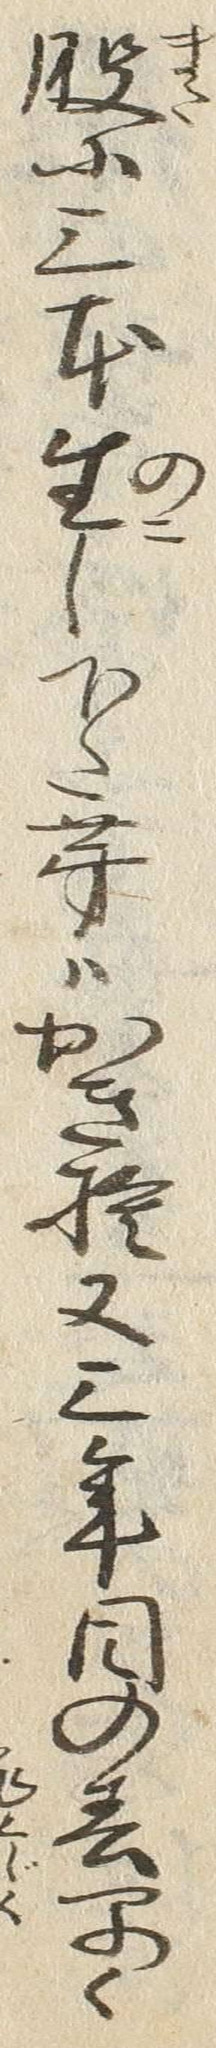股尓三本生し下た芽はかき捨又三年目の春早く
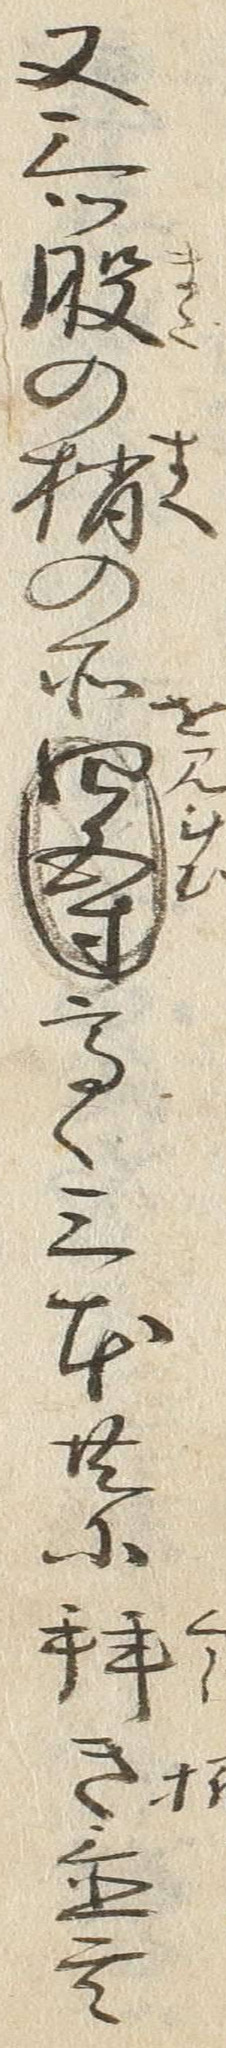又三ツ股の梢の所を見斗ひ高く三本共尓拜き置其
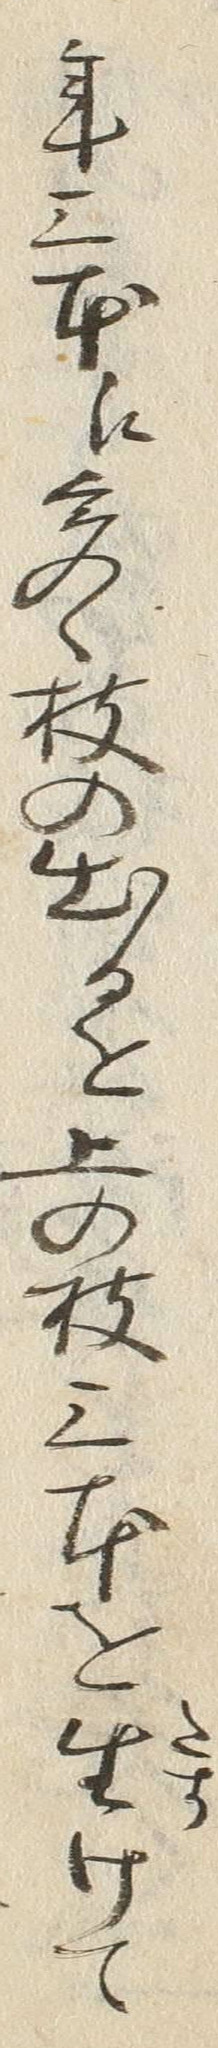年三本江多く枝の出るを上の枝三本を生けて
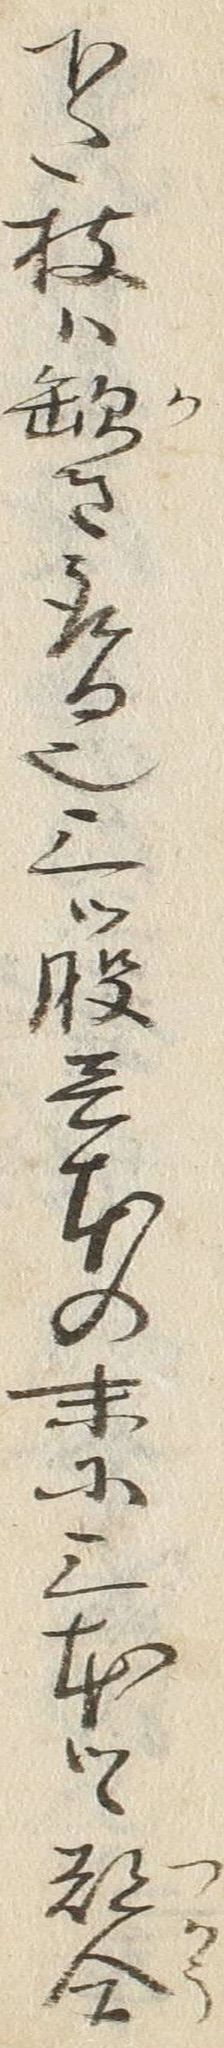下た枝は缼き取る也三ツ股壱本の末尓三本ツゝ都合
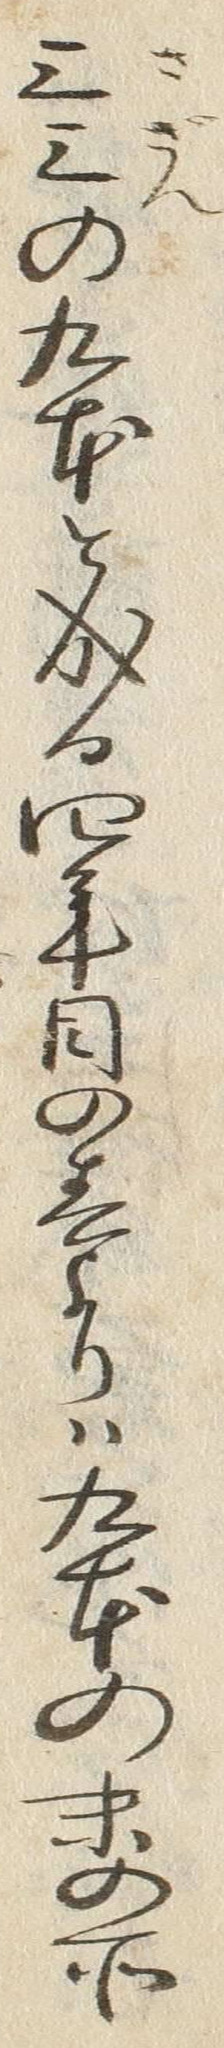三三の九本と成る四年目の春よりは九本の末の所
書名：養蠶實驗録後編
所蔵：東京大学農学生命科学図書館 国文学研究資料館
